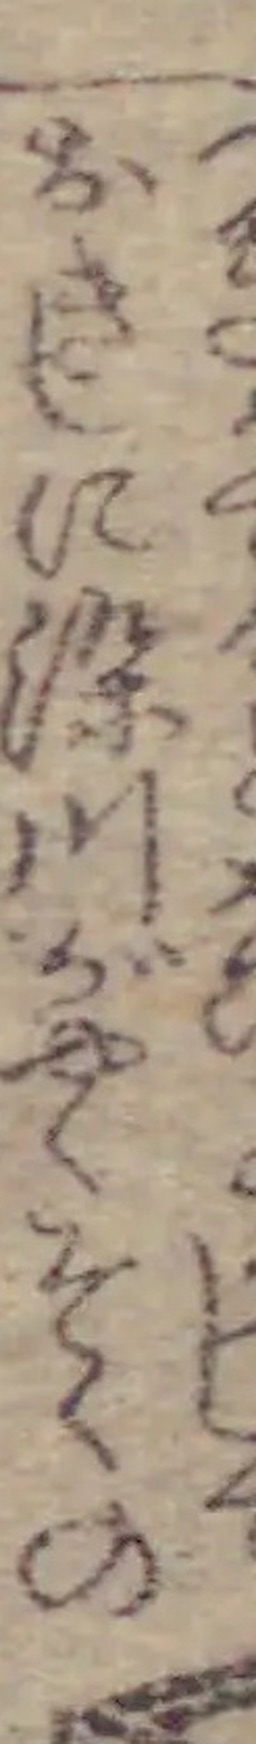おきしに染川がやくそくの
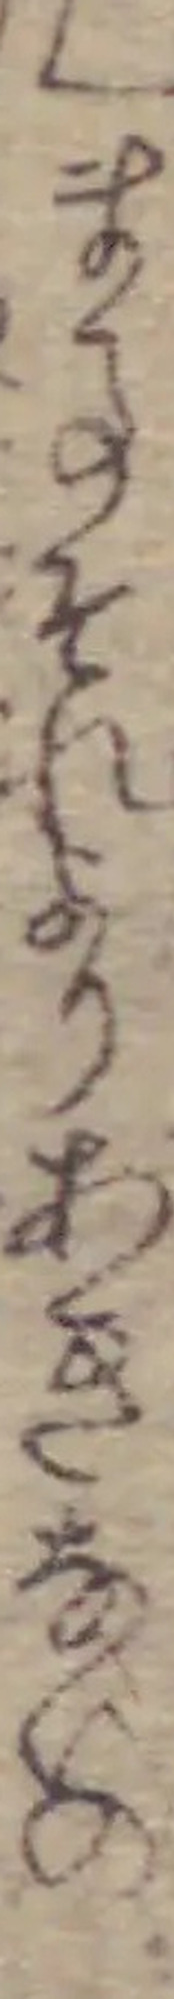ま事それよりあきないの
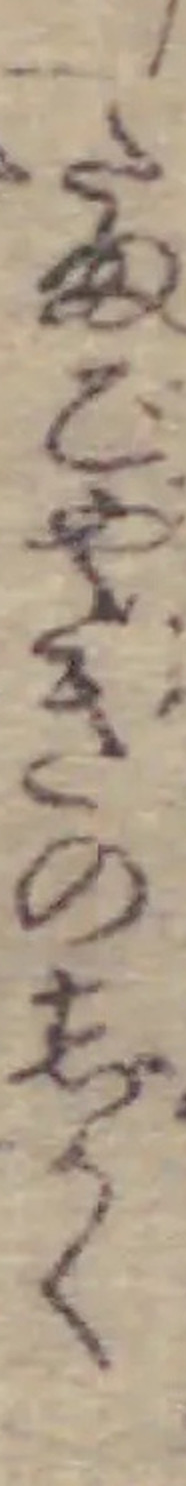たまごやきのしかく
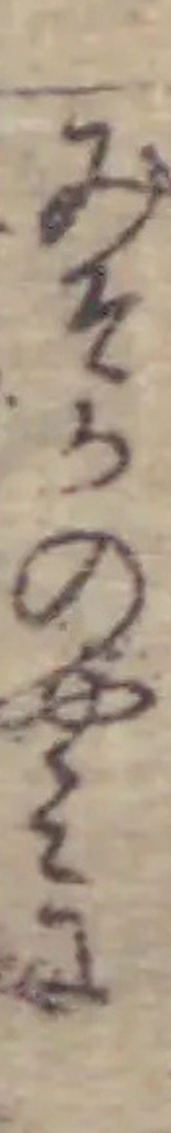みそかのやみに
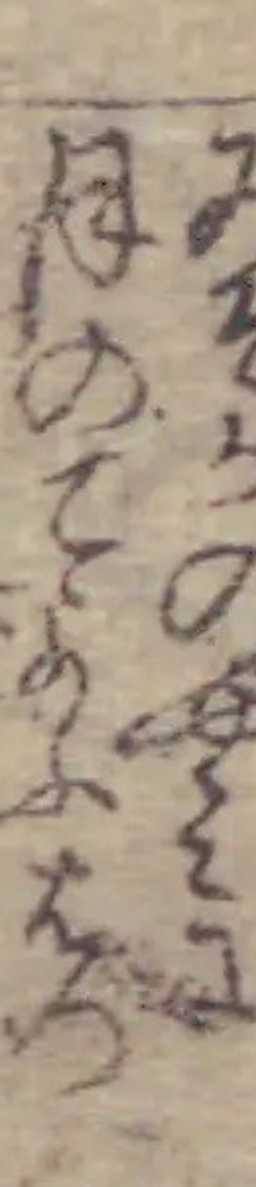月のてよふはつ
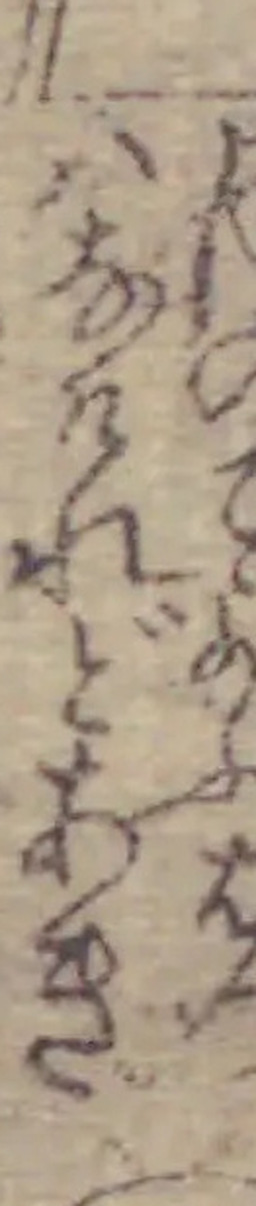はなけれどあき
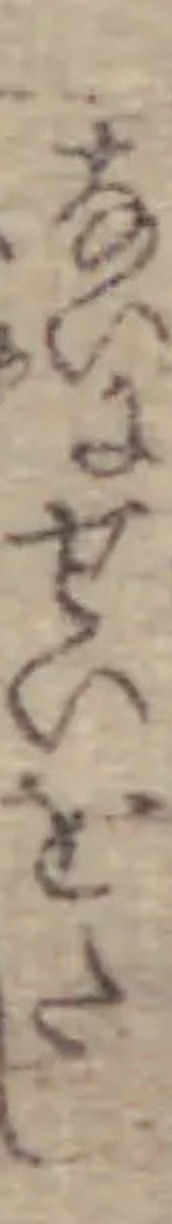ないにせいをだし
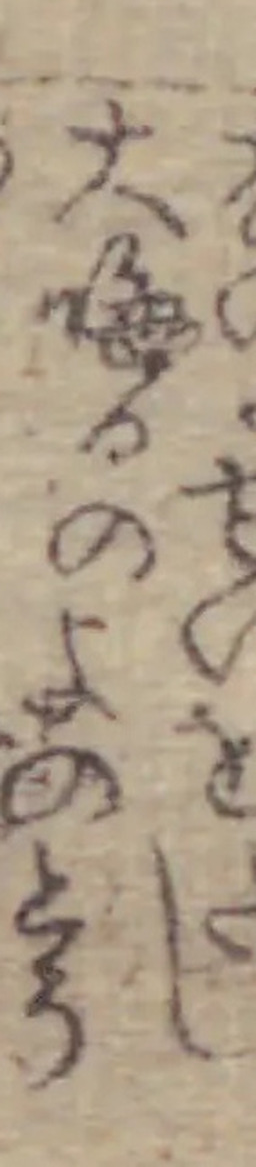大晦日のよのとう
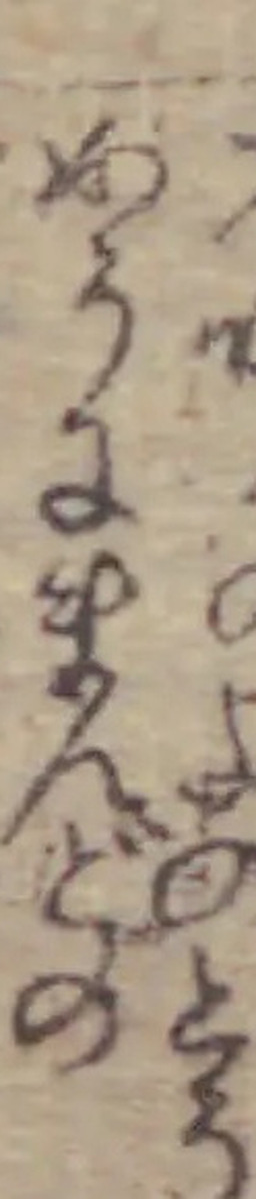めうにまんどの
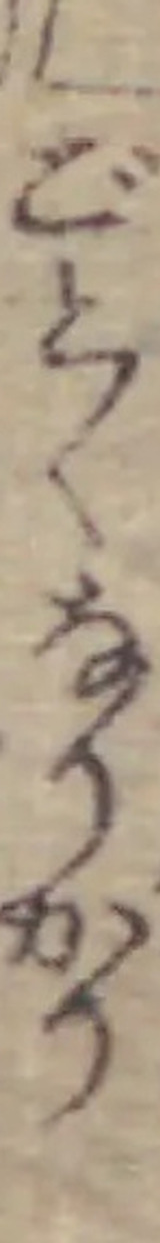ごとくなりかり
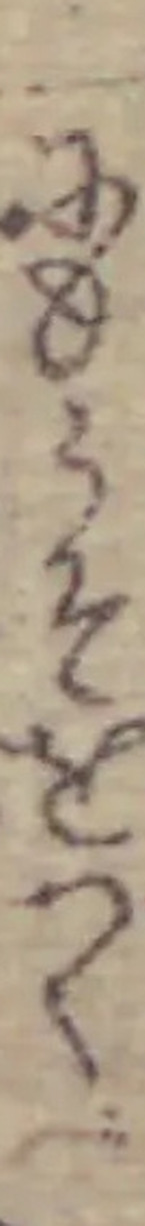にもうそをつく
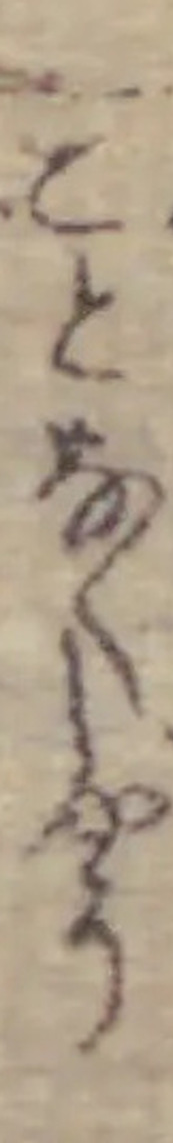ことなくしやう
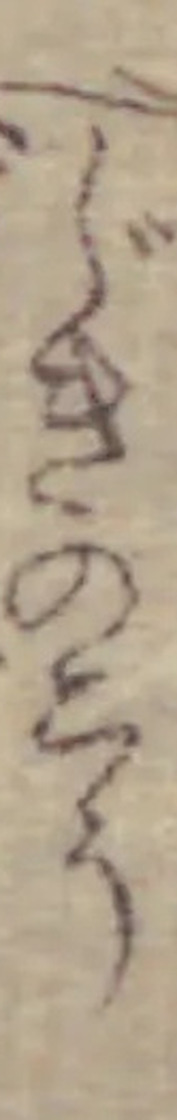じきのこう
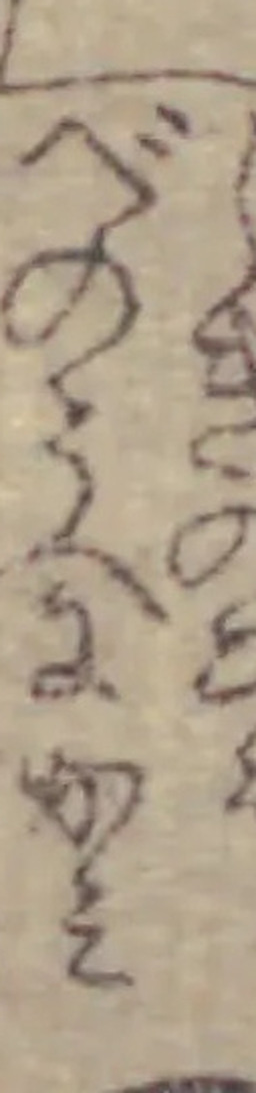べのうへにかみ
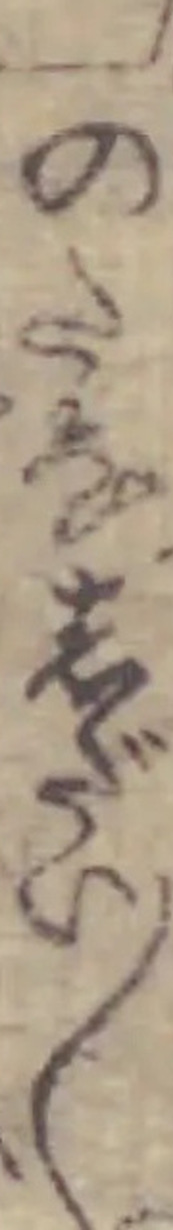のたなしだい〳〵
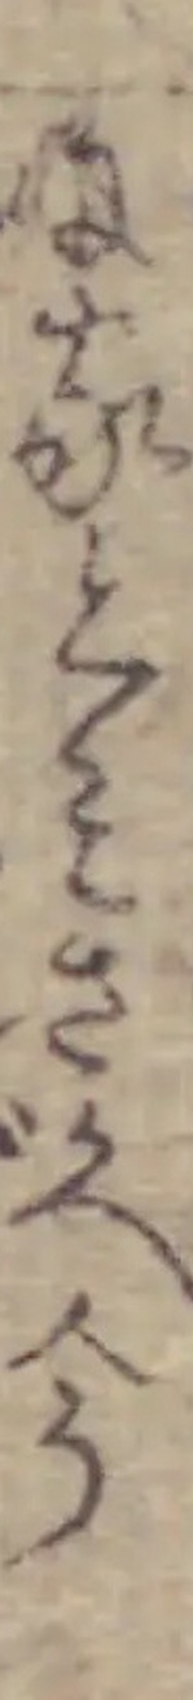に家とみさかへ今
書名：虚言弥二郎傾城誠 3巻
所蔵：国立国会図書館 National Diet Library, JAPAN
